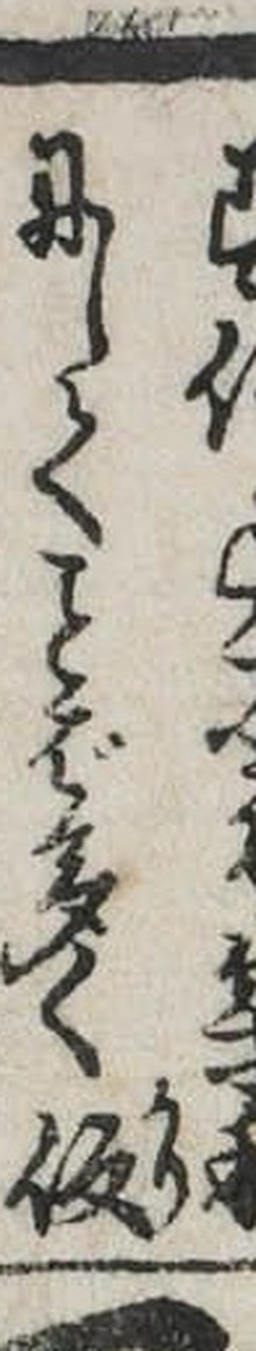にしてことば多く仮
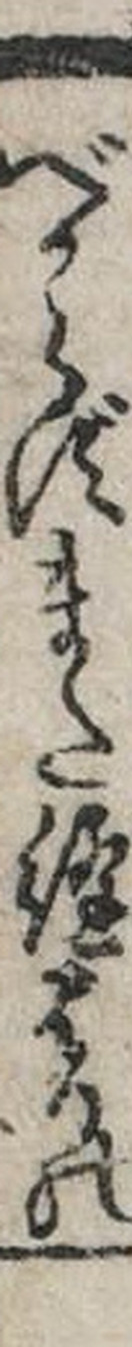べからずまた縫はりの
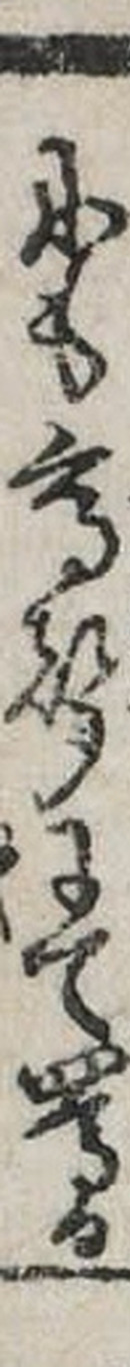にも高声にて罵る
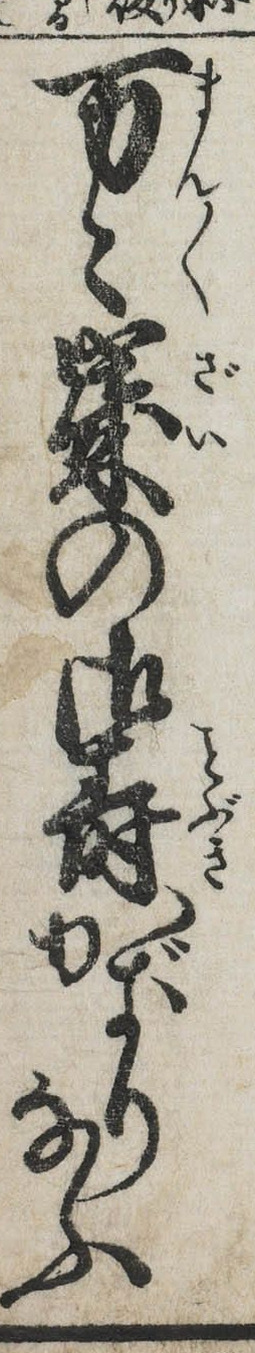万々歳の御寿かぎりなふ

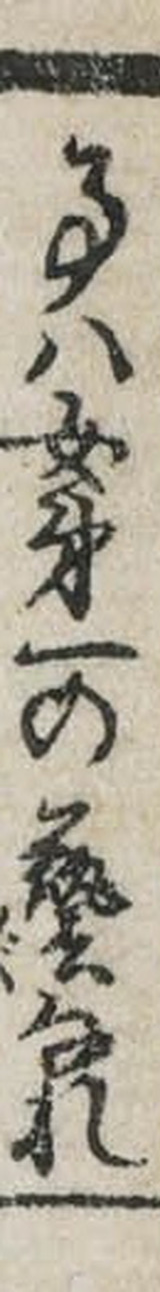事は女第一の芸なれ
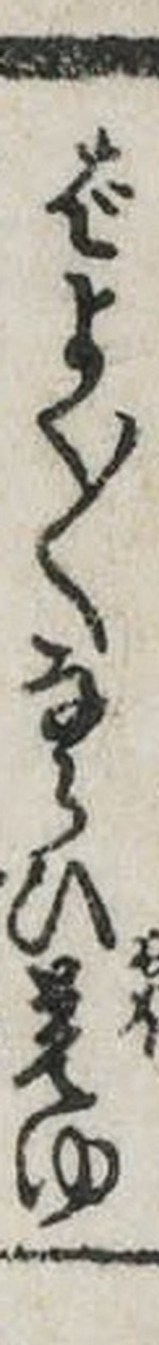ばよく〳〵ならひ覚ゆ
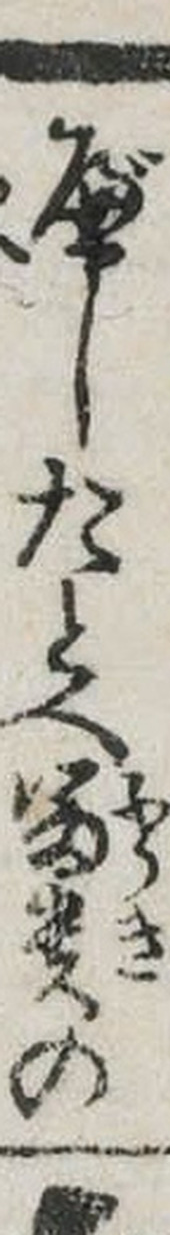べしたとへ富貴の
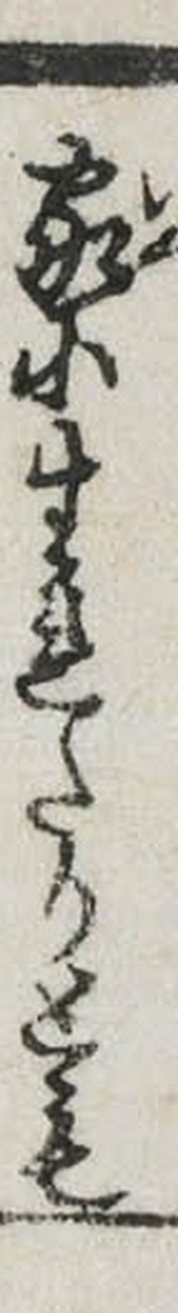家に生れたりとも
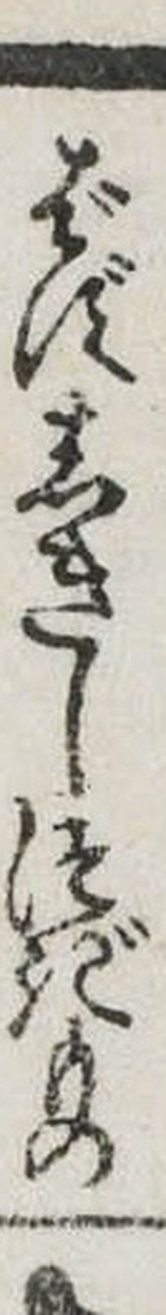ばずしきしつぎもの
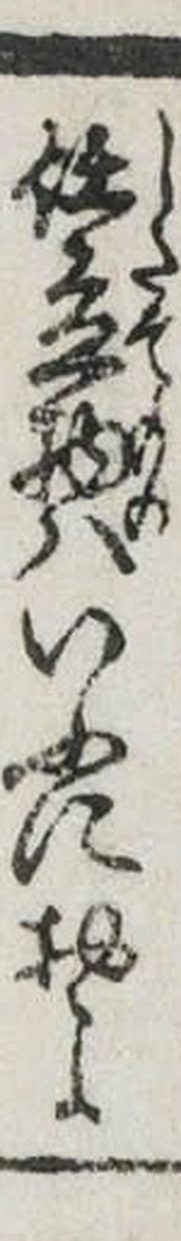仕立物はいふにおよ
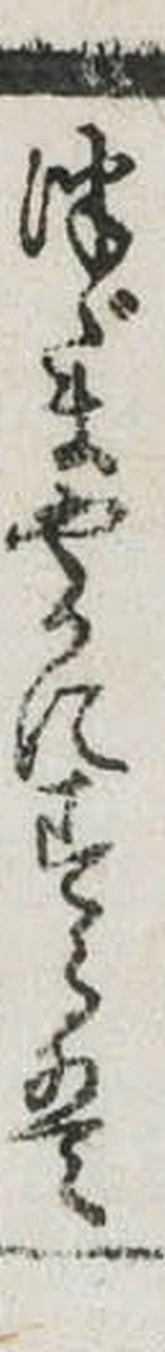つゞまやかにするは
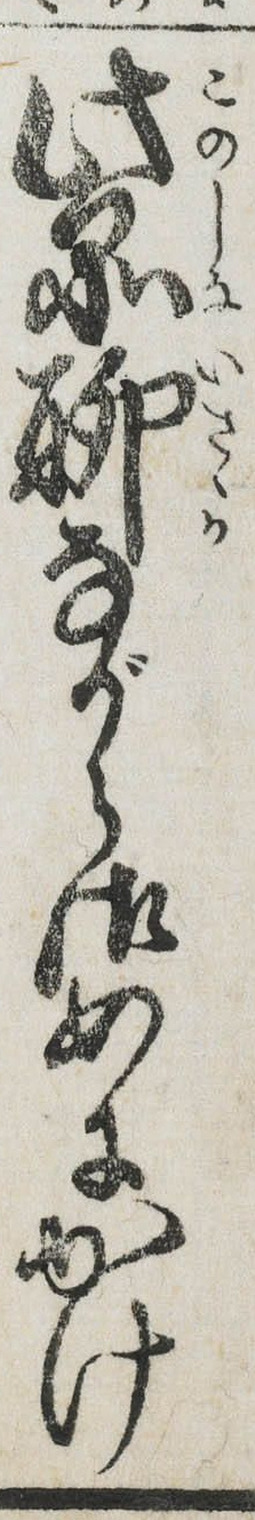此品聊ながら御めにかけ
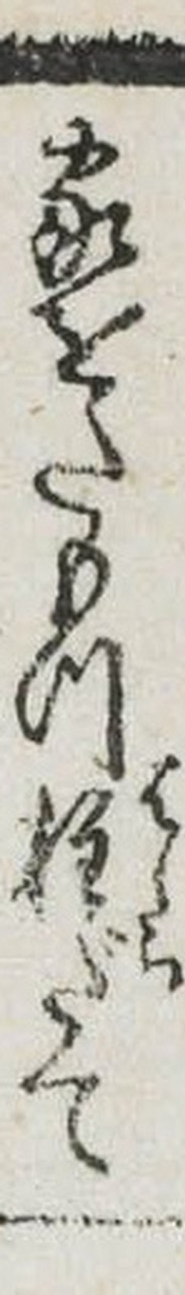家をたもつ柱だて
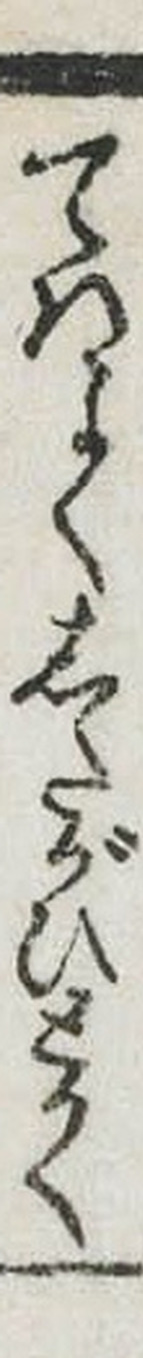てはよくしたがひとかく
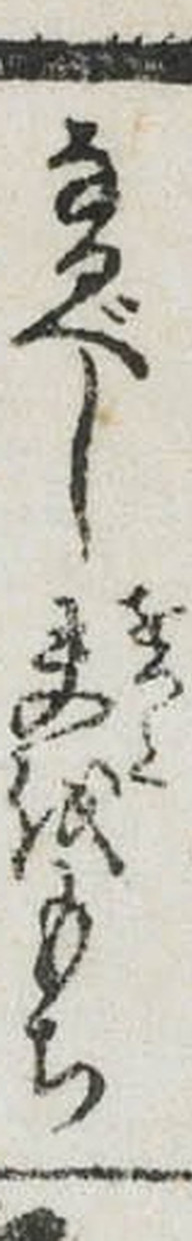なるべし夫をもち
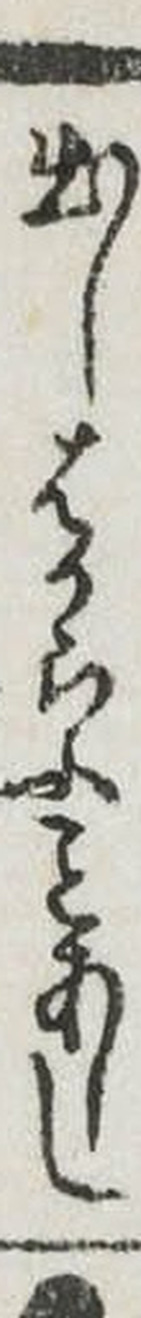出しはからふことあしし
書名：頭書萬用婦人手紙之文言
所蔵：東京学芸大学教育コンテンツアーカイブ
